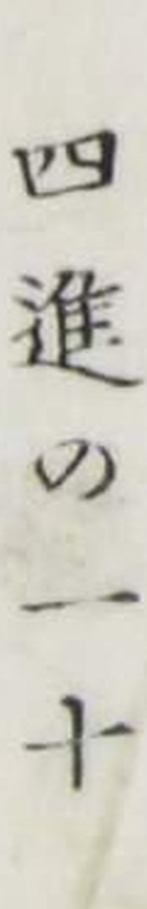四進の一十
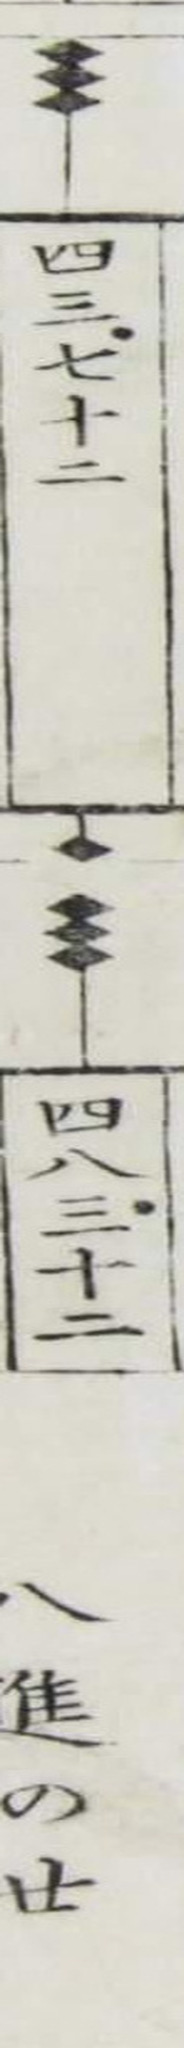四三．七十二四八．三十二
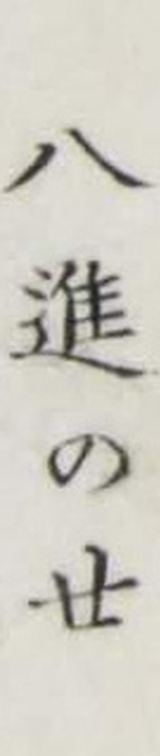八進の廿
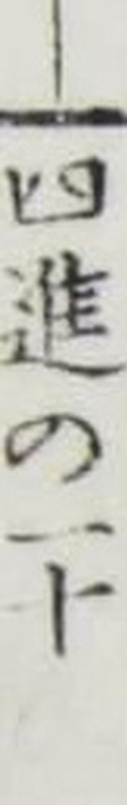四進の一十
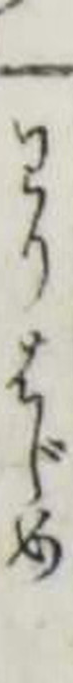わりはじめ

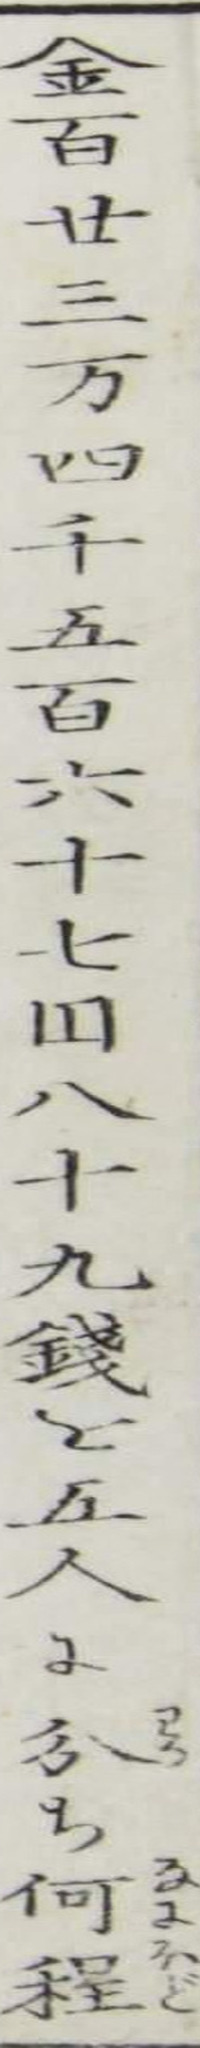金百廿三万四千五百六十七円八十九銭を五人に分ち何程
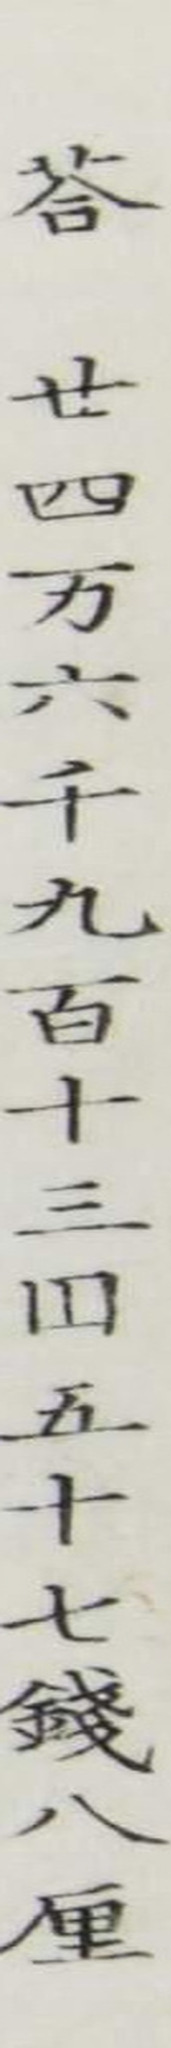答廿四万六千九百十三円五十七銭八厘
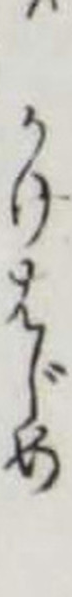わりはじめ
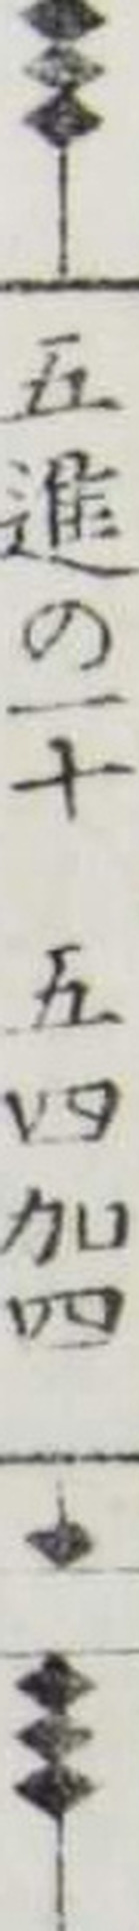五進の一十五四加四五八．四十
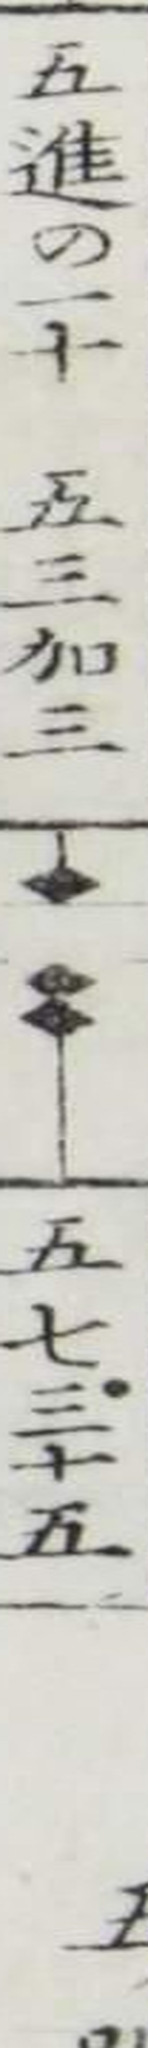五進の一十五三加三五七．三十五
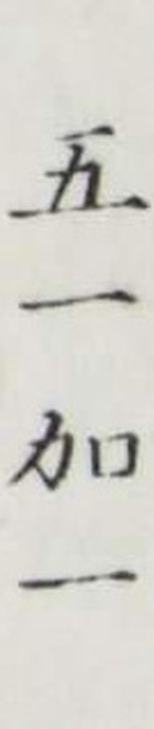五一加一
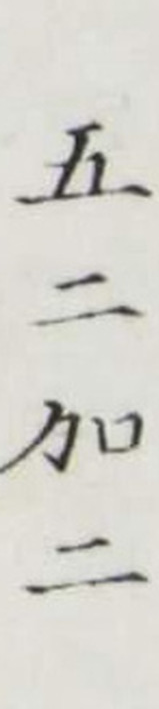五二加二
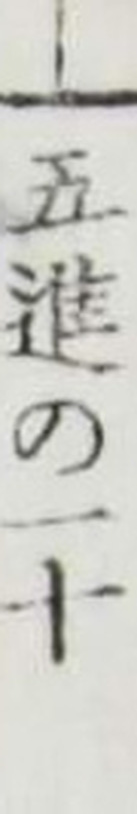五進の一十
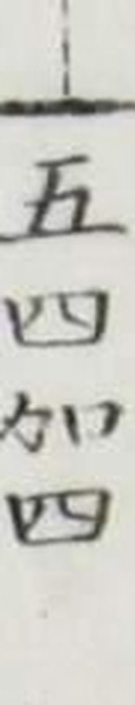五四加四
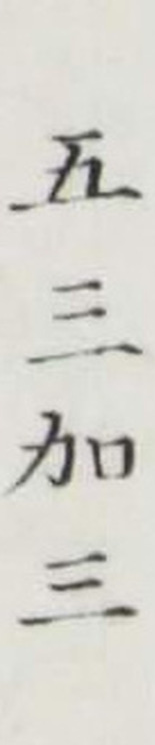五三加三
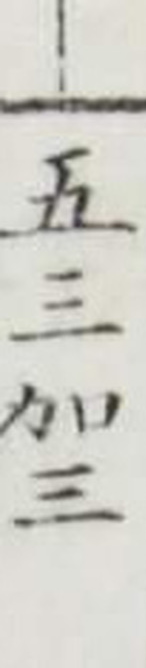五三加三
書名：明治小學塵劫記 卷1
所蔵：東京学芸大学教育コンテンツアーカイブ
